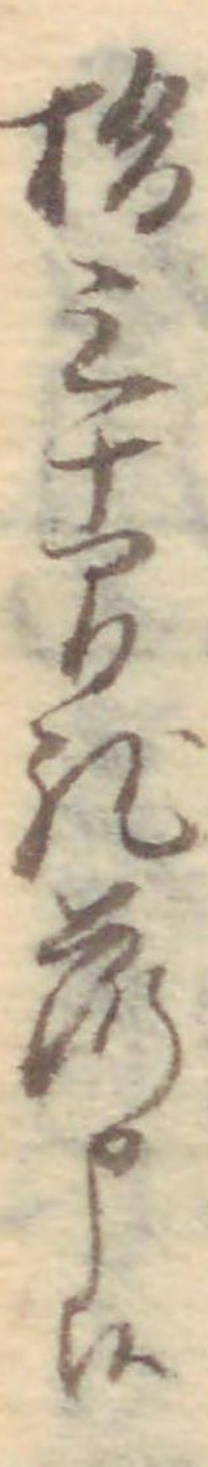橋三十間程落申候

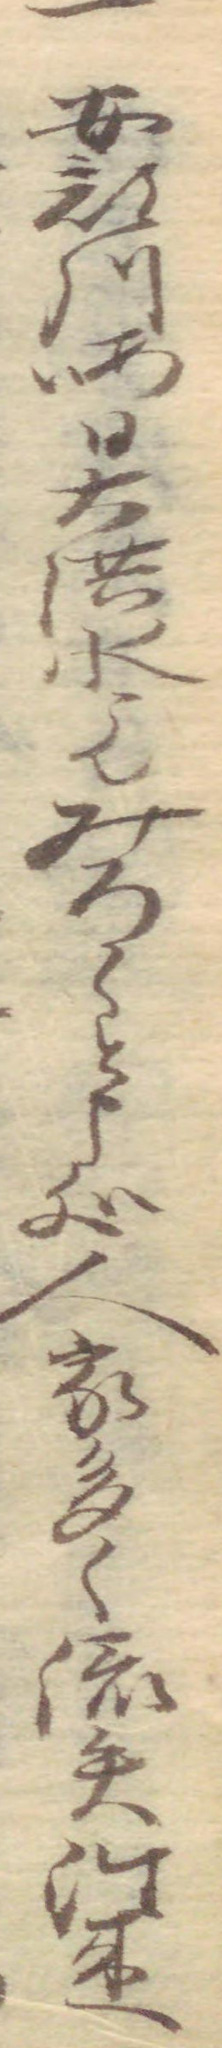一安部川晦日大洪水ニてみろくと申候処人家多く流失往来へ
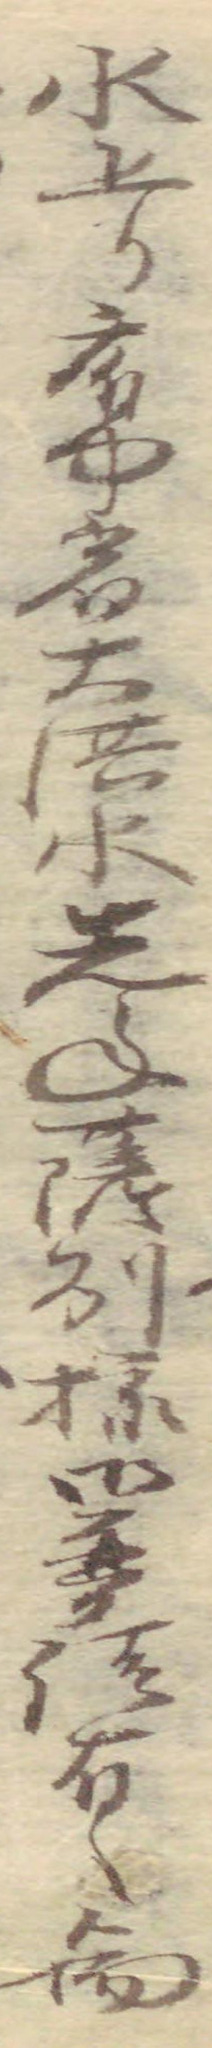水上り府中宿大洪水先年薩州様御普請有之候場
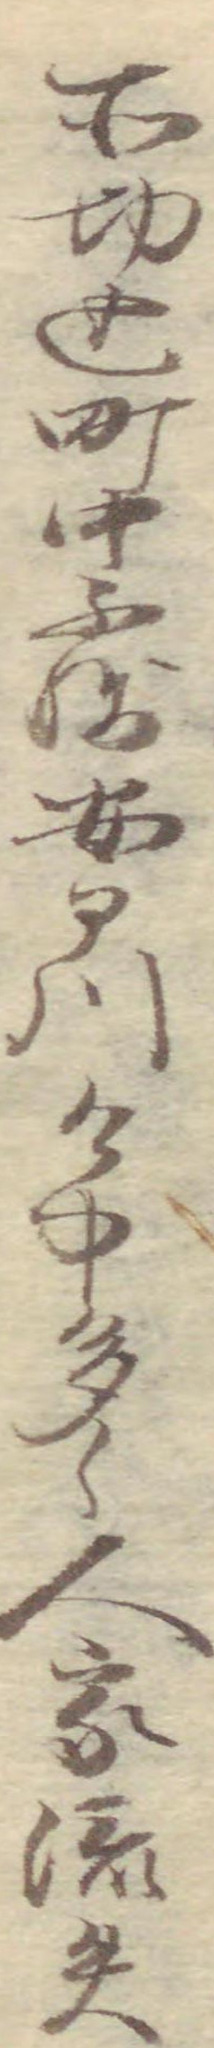所切込町中不残安部川ケ中多く人家流失
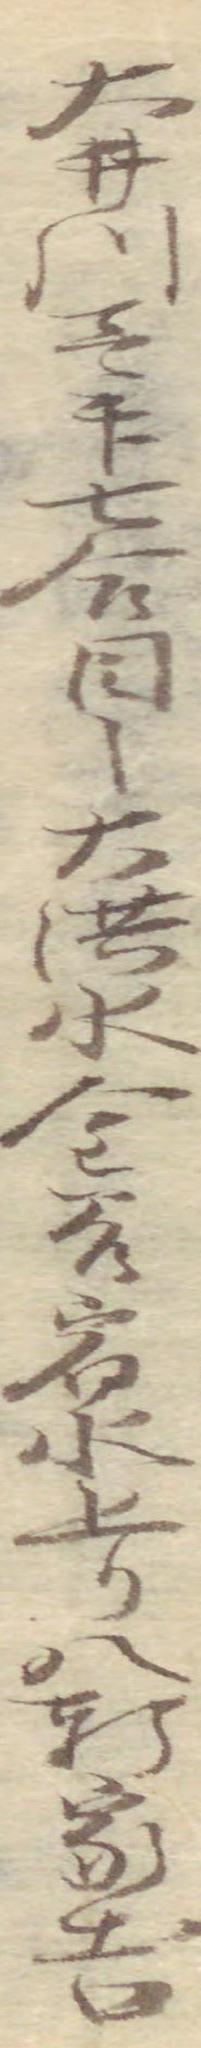一大井川壱升七合目之大洪水金谷宿水上り八軒家出口
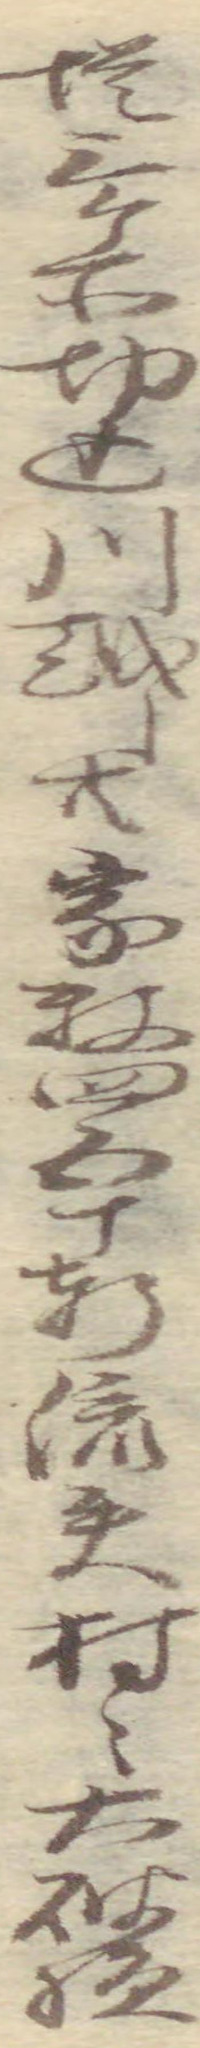堤三ヶ所切込川越候共家数四五十軒流失村々大破損
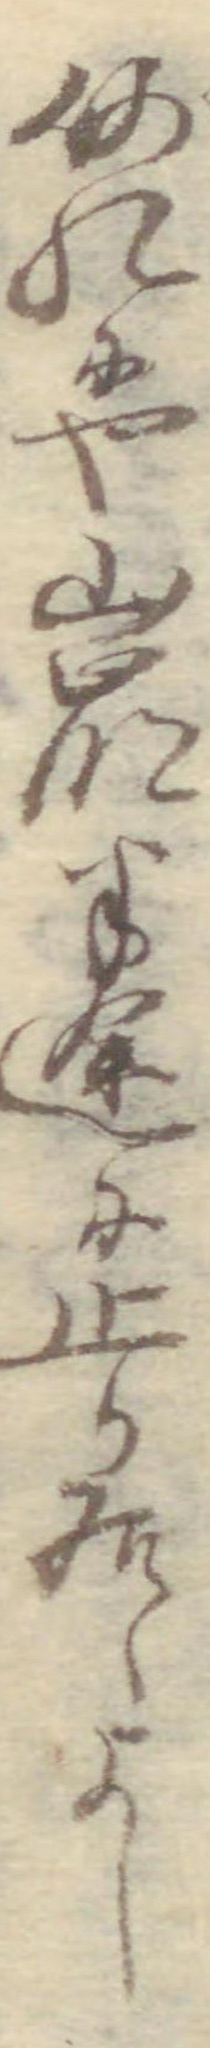何れにや山崩半途に止り居候よし
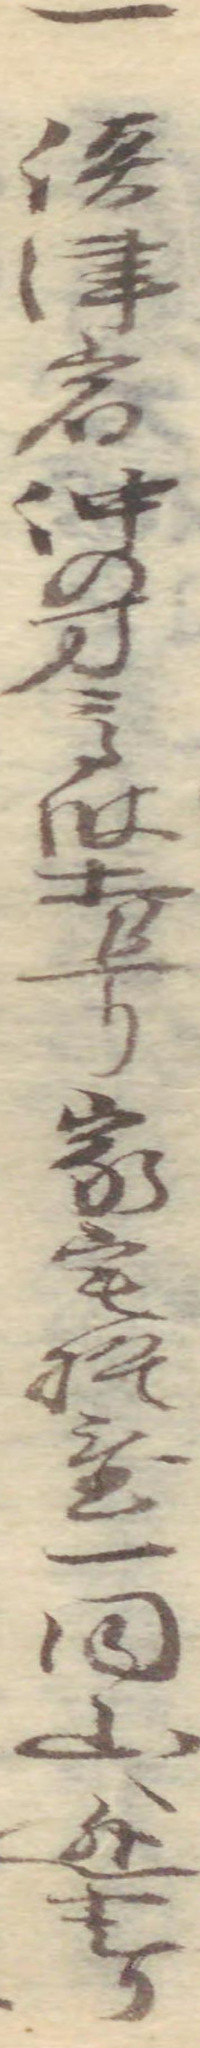一澳津宿沖の方高波打上り家宅捨置一同山へ逃登り
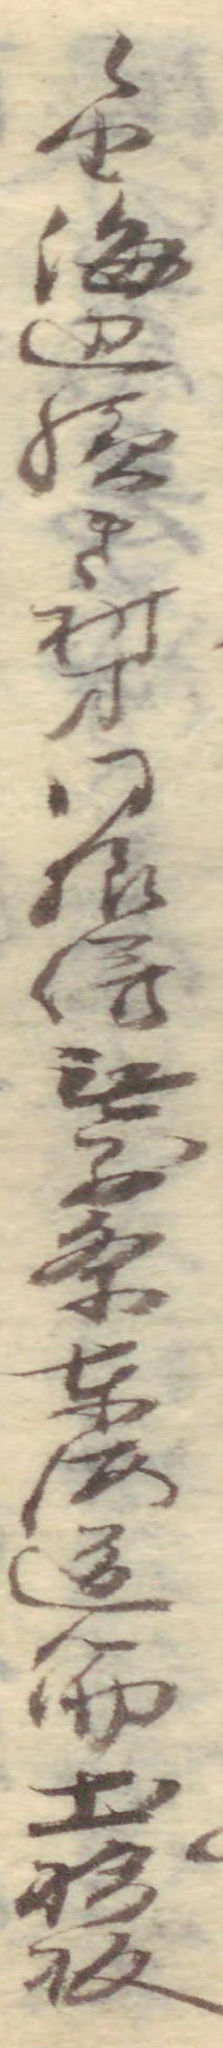之由海辺続き村方同様併無別条東海道筋土橋板
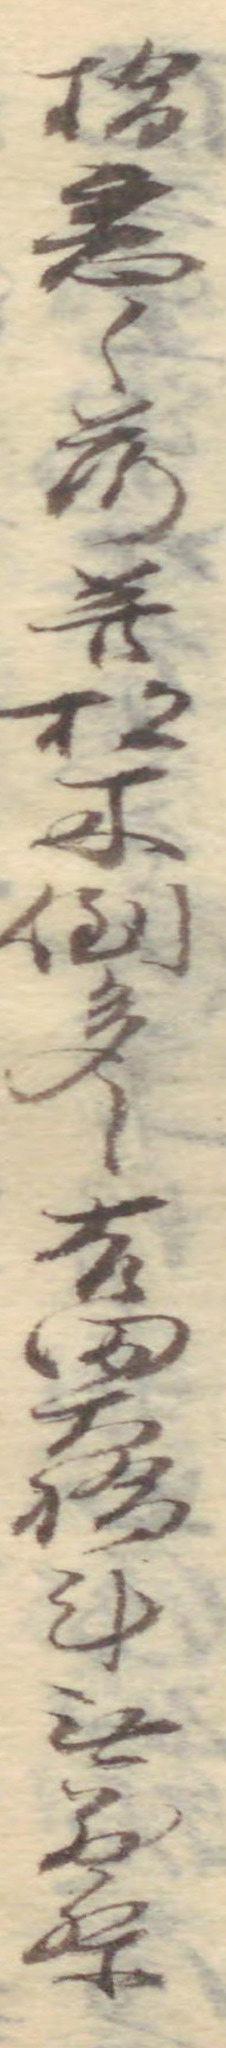橋悉く落幷松木倒多し吉田大橋斗無別条
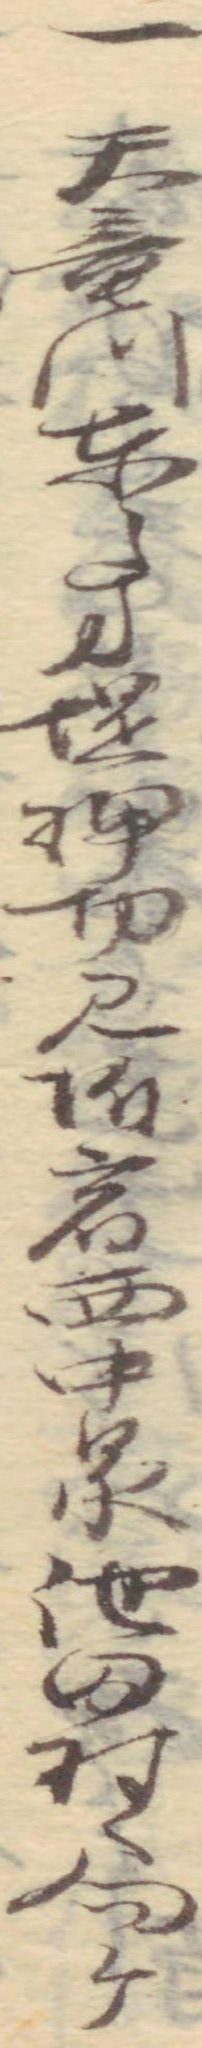天竜川東之方堤押切見附宿西中泉池田村へ向ケ
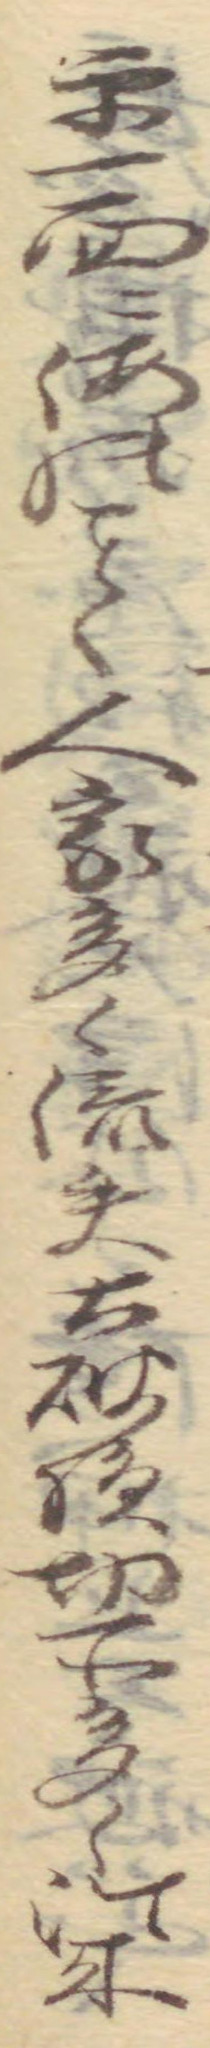平一面ニ海のことく人家多く流失大破損切所多く往来
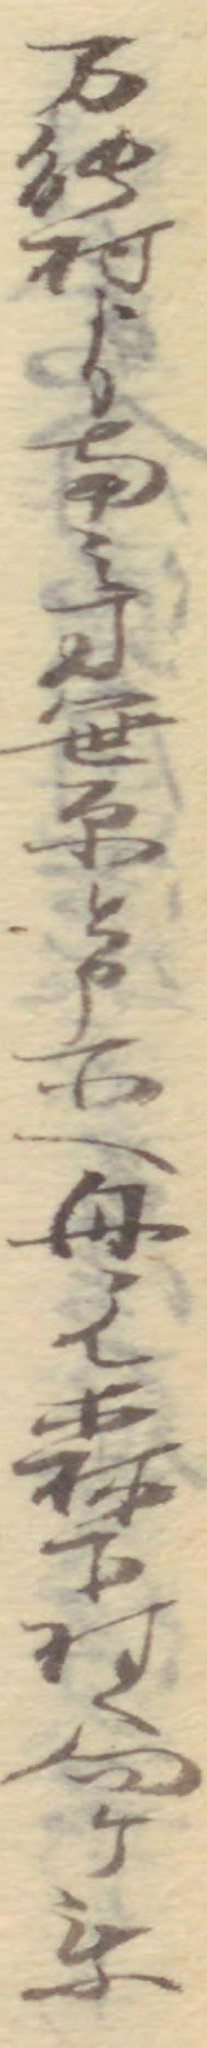万能村より南之方笹原と申所へ舟ニて森下村へ向ケ乗
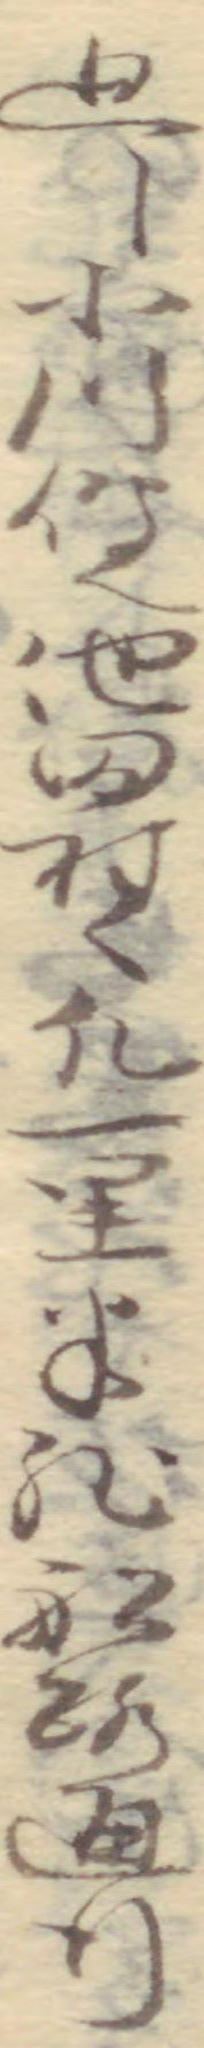廻し小川伝へ池田村へ凡一里半程船路通行
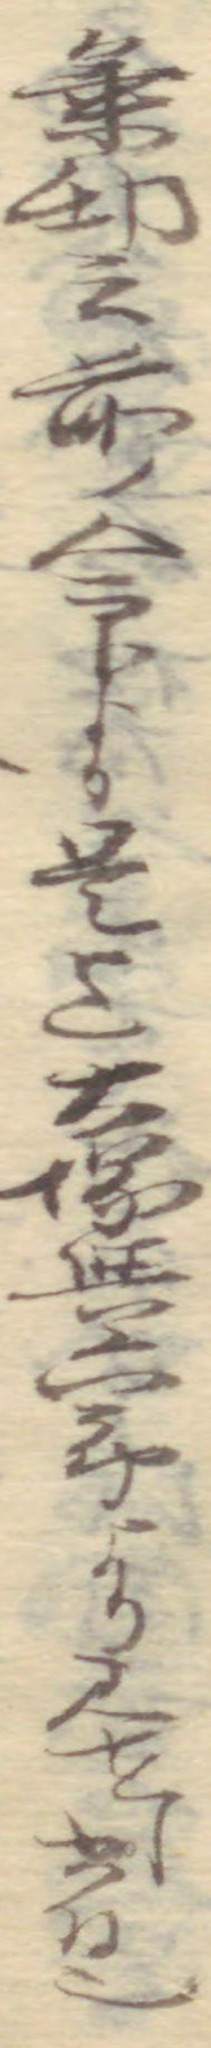乗邨之前ノ△印より是迄大塚與六郎より見せ候書付也
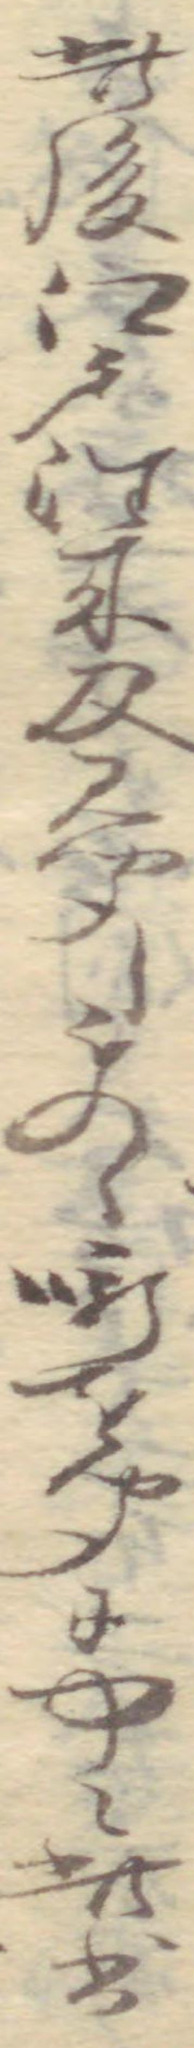此後江戸往来及見聞候ものゝ噺を聞に中々此書
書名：鶯宿雑記. 巻199-200
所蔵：国立国会図書館 National Diet Library, JAPAN
